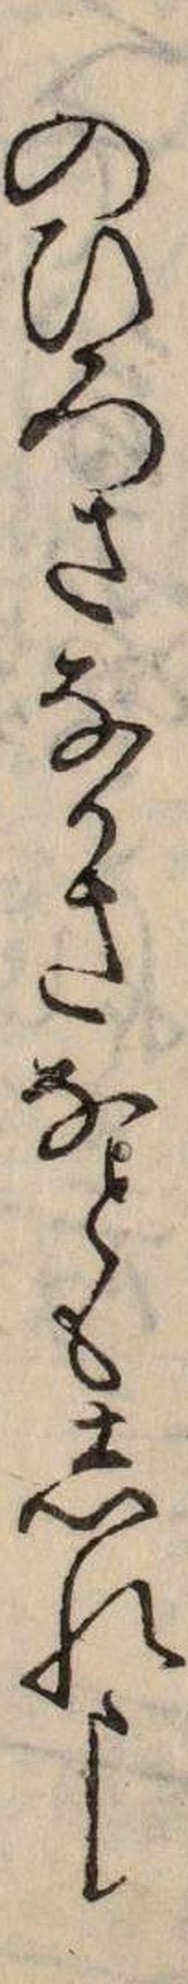のひろさなかさなともしれ申候
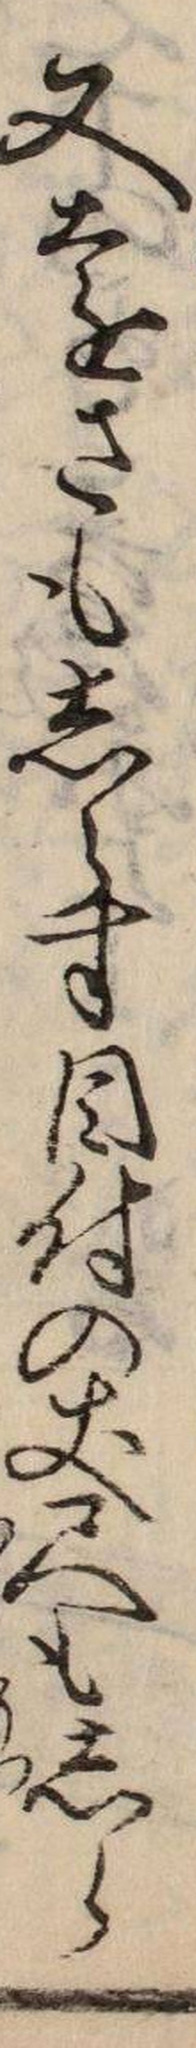又遠さもしらす目付の丈尺もしら
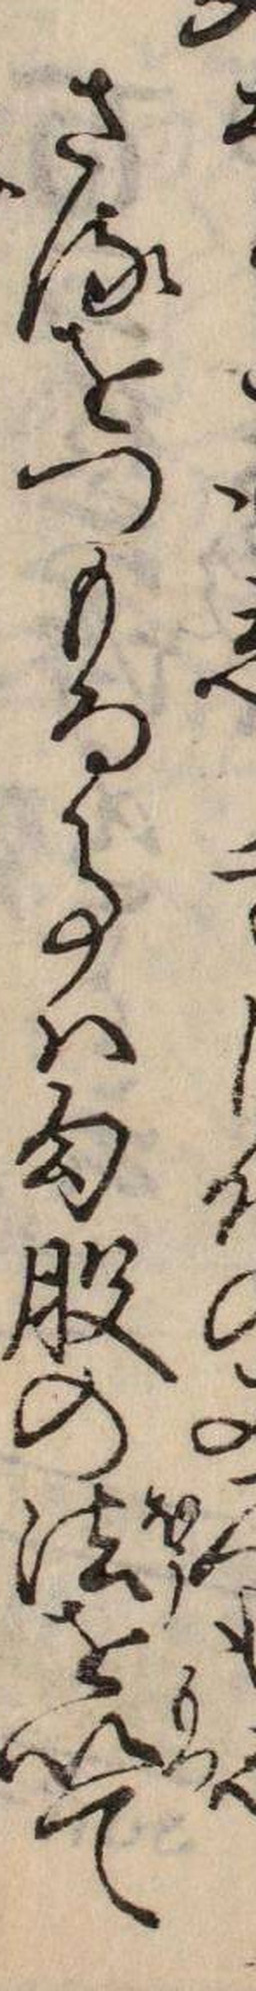さるをつもる事は勾股の法を以て
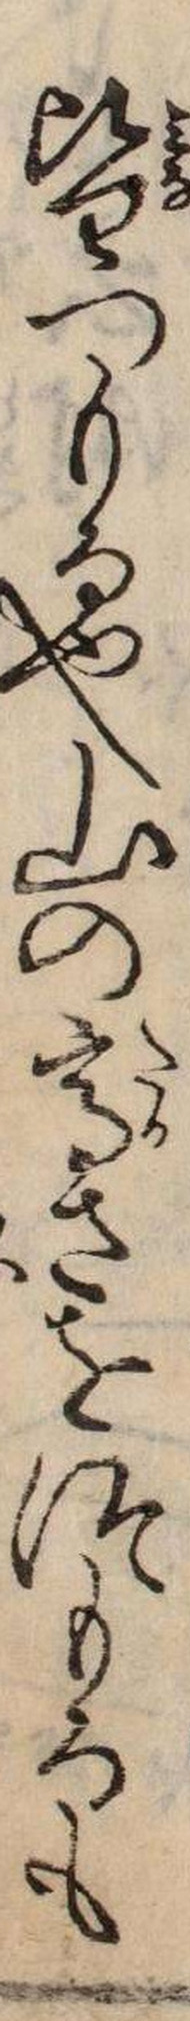皆つもるや山の高きをつもろも
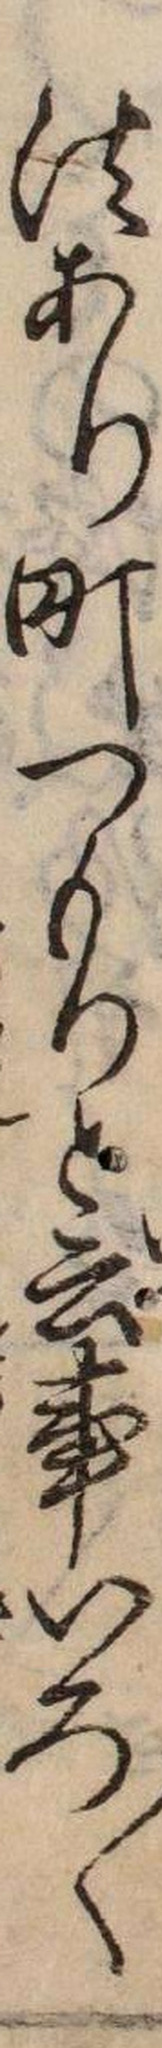法あり町つもりと云事いろいろ
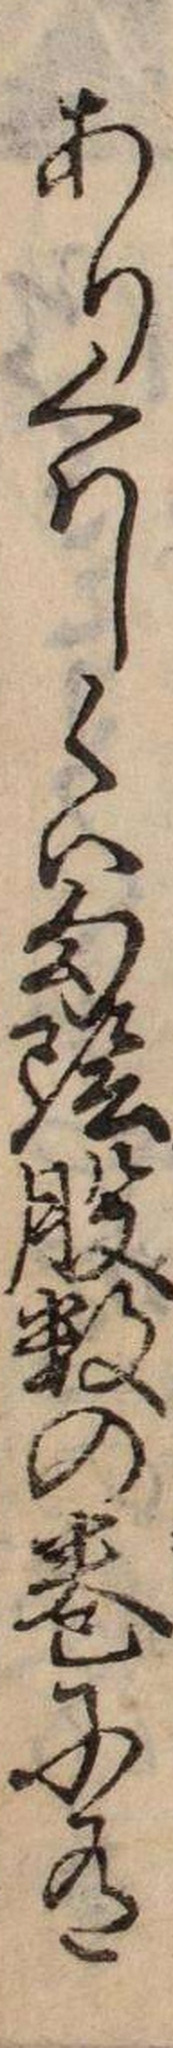ありくはしくは勾弦股数の巻に有

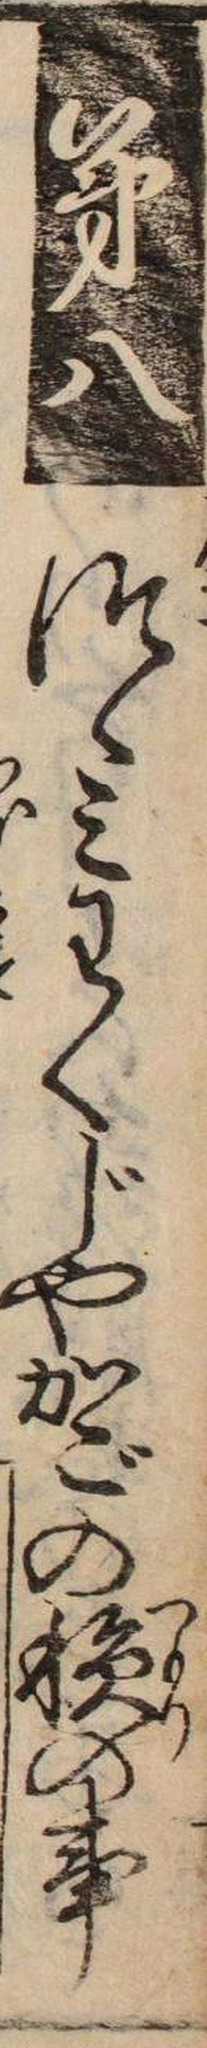つつみわくじやかごの積の事
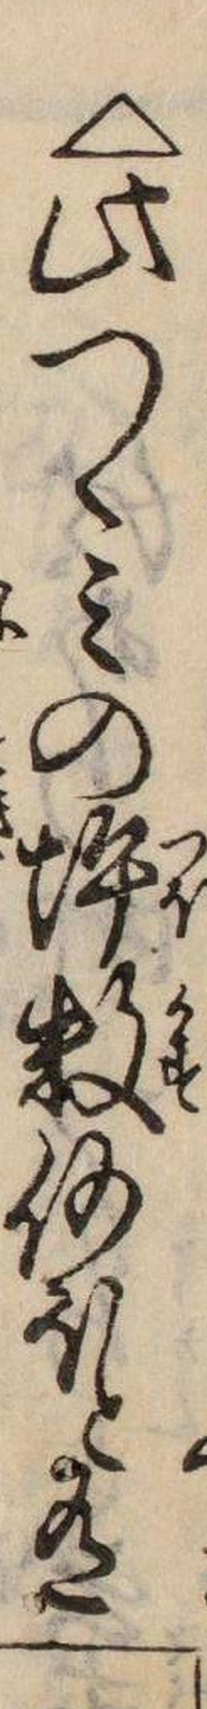△此つつみの坪数何ほと有
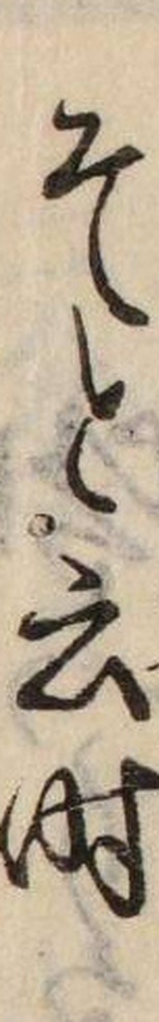そと云時
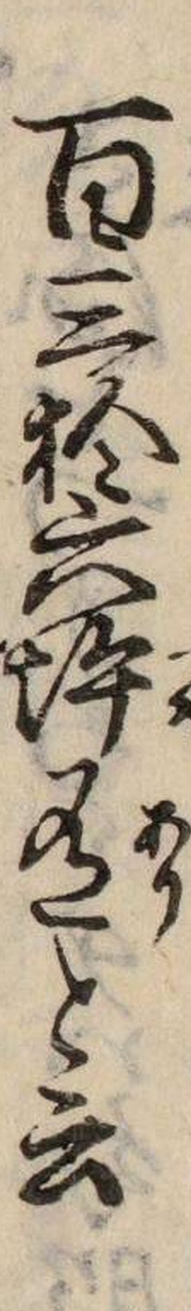百三拾六坪有と云
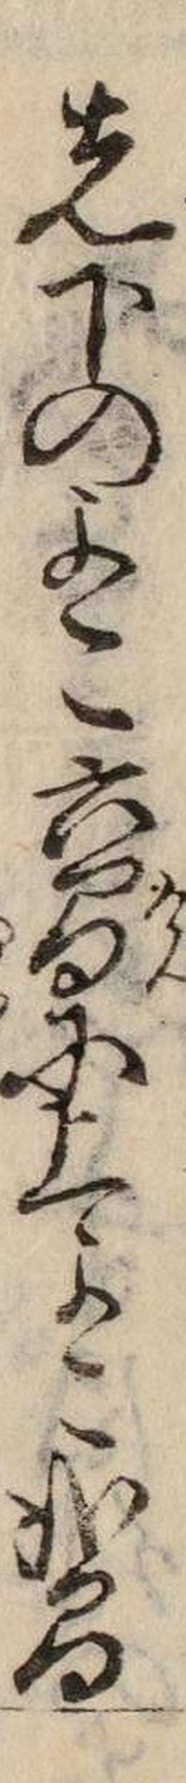先下のよこ六間に上よこ弐間
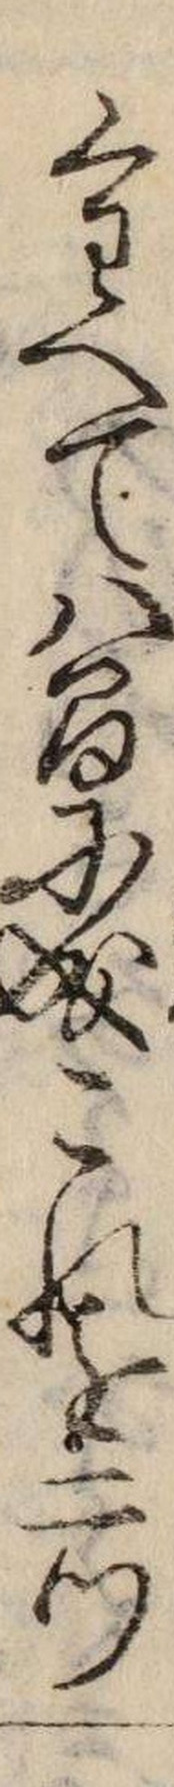くわへて八間に成これを二つ
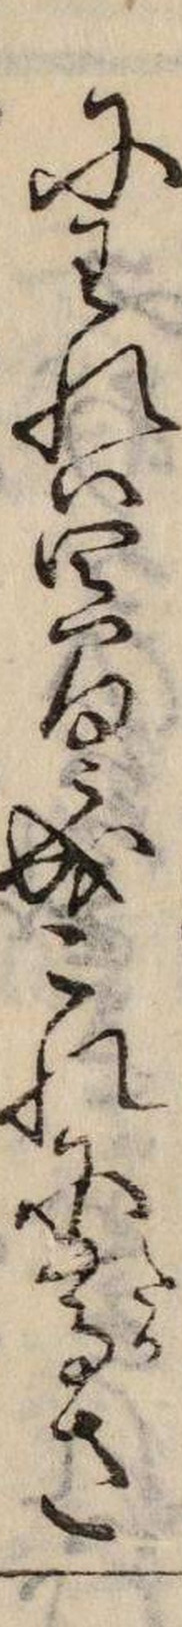にわれは四間に成これに高さ
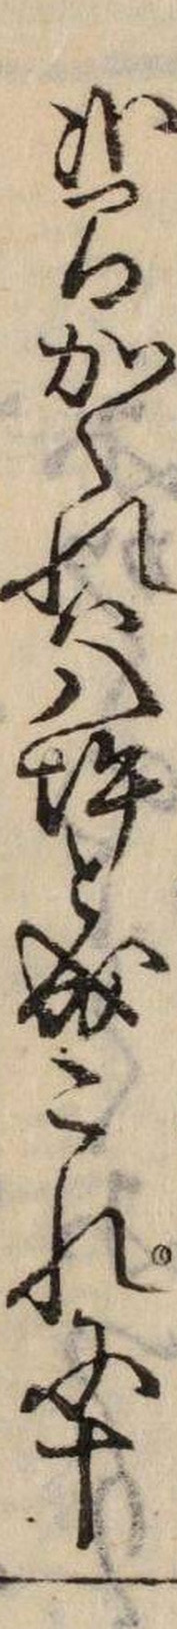弐間かくれは八坪と成これに十
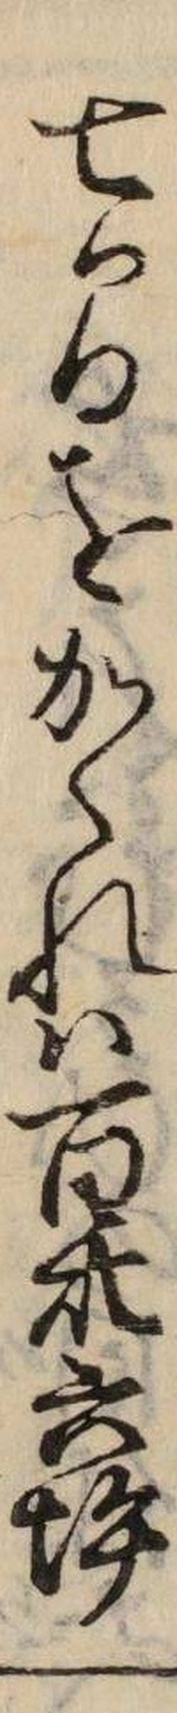七日をかくれは百卅六坪
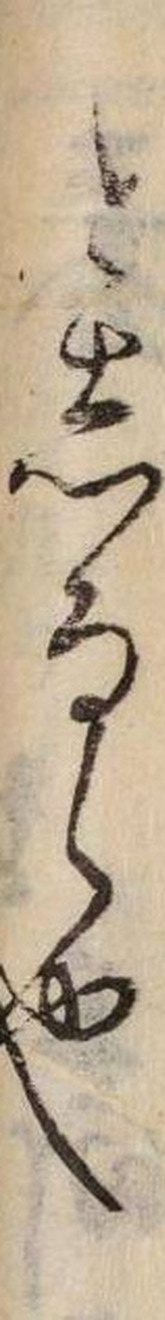としるる也
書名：塵劫記（寛永11年自跋、京都府立京都学・歴彩館追貴8）
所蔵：京都府立京都学・歴彩館 国文学研究資料館
